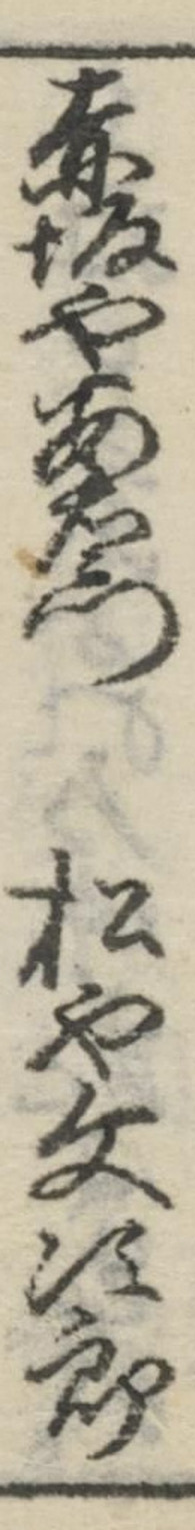赤坂や安右衛門松や文次郎
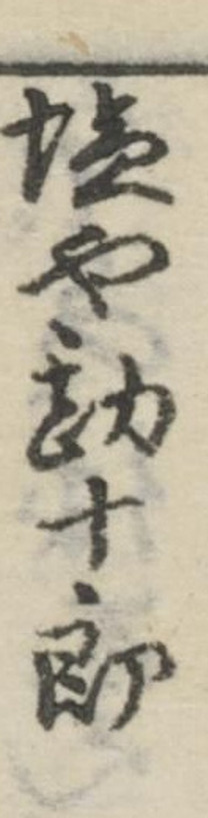塩や勘十郎
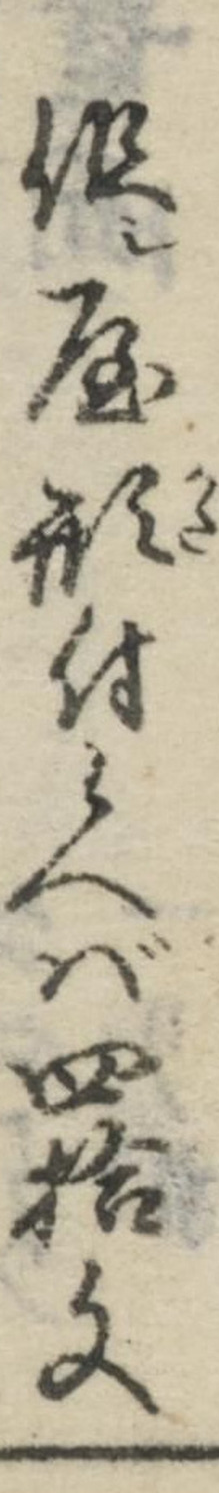但し屋形付らへば四拾文
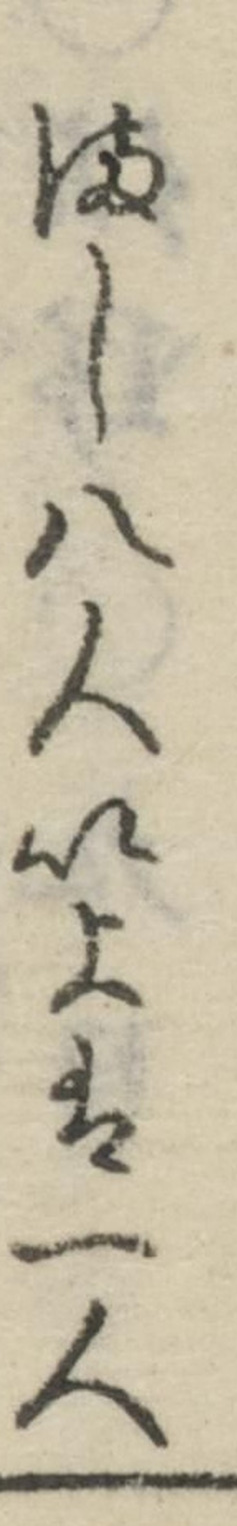まし八人以上は一人
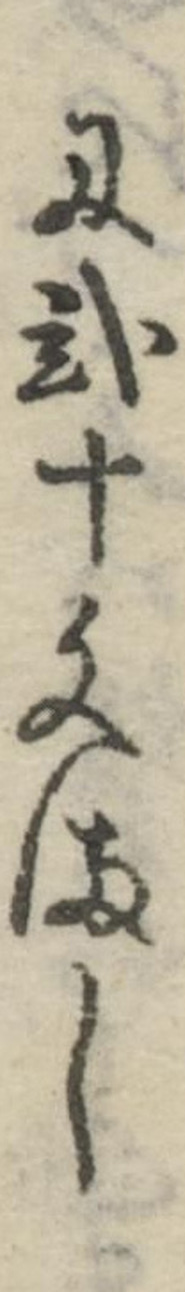に弐十文まし
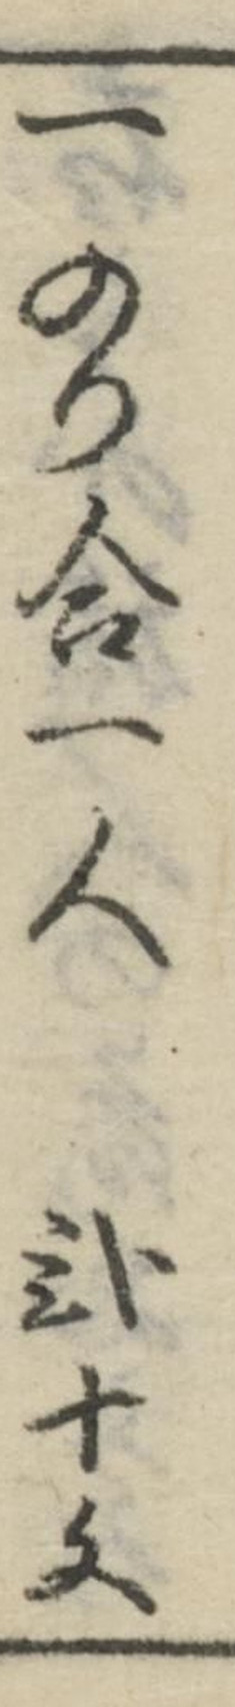一のり合一人弐十文
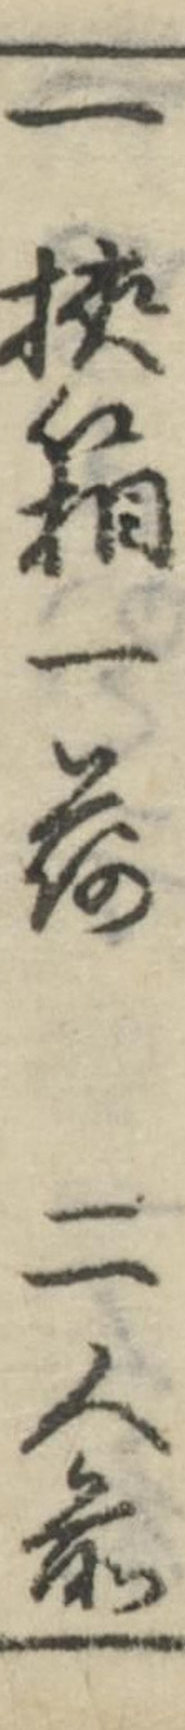一挟箱一荷二人前

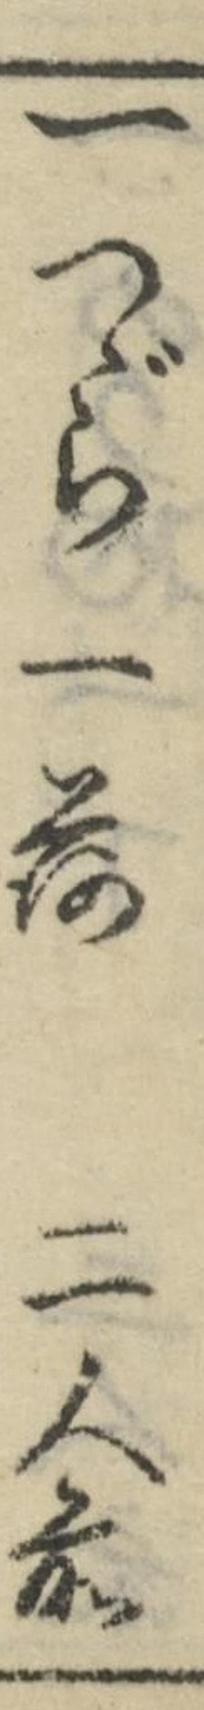一つゞら一荷二人前
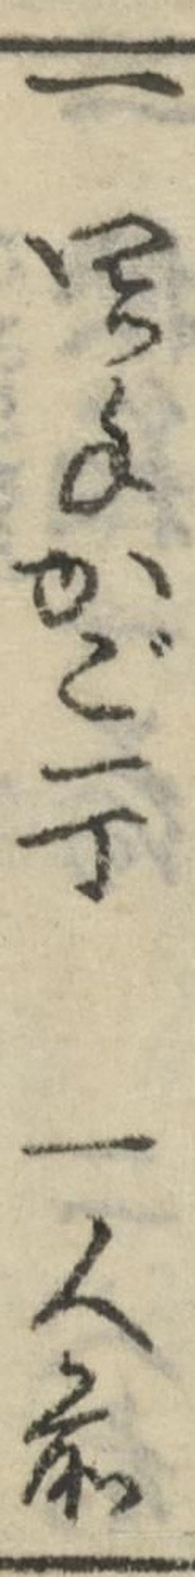一四つ手かご一丁一人前
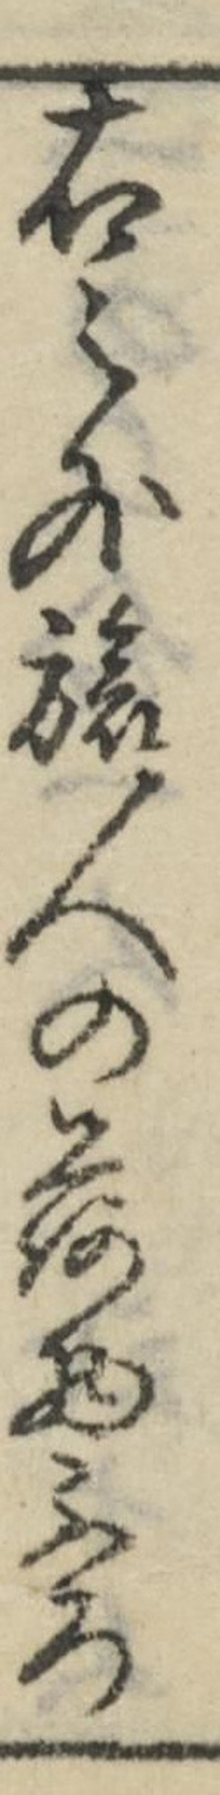右之外旅人の荷物ふろ
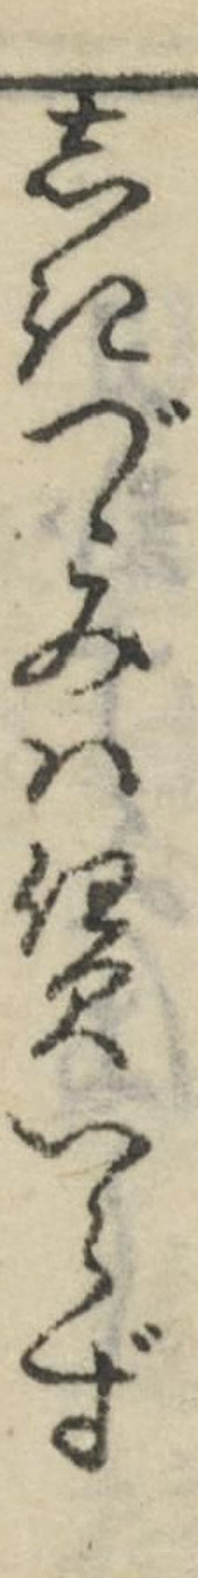しきづゝみは賃いらず
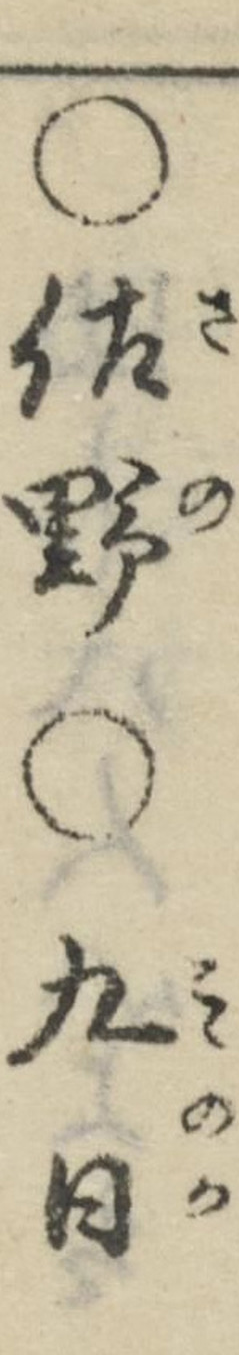○佐野○九日
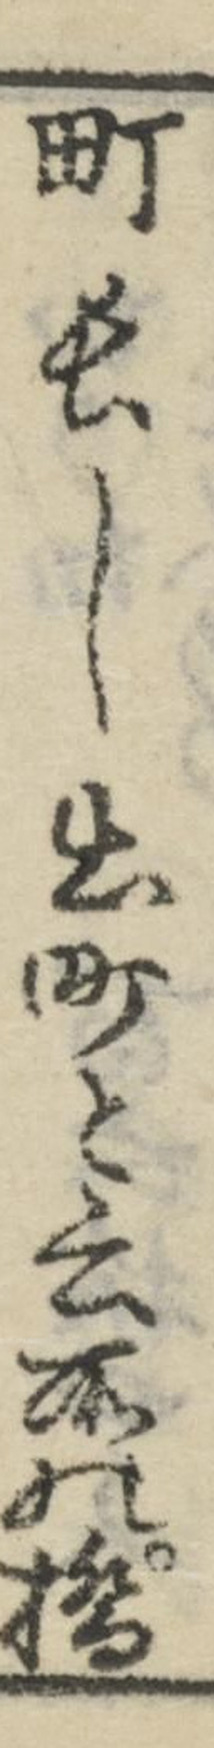町長し出町と云所の。橋
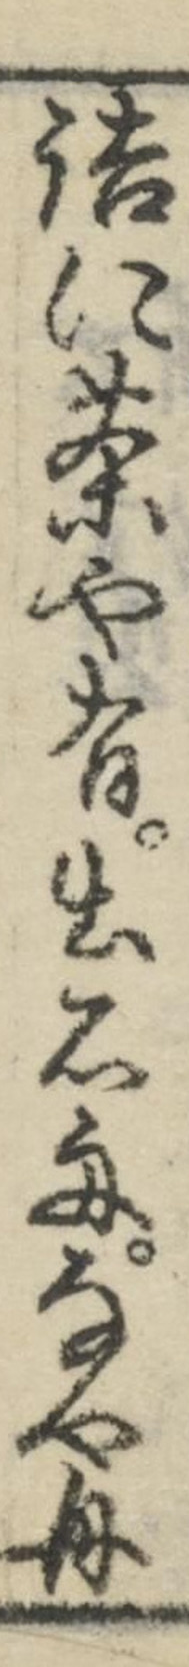詰に茶や有。出石舟。なや舟
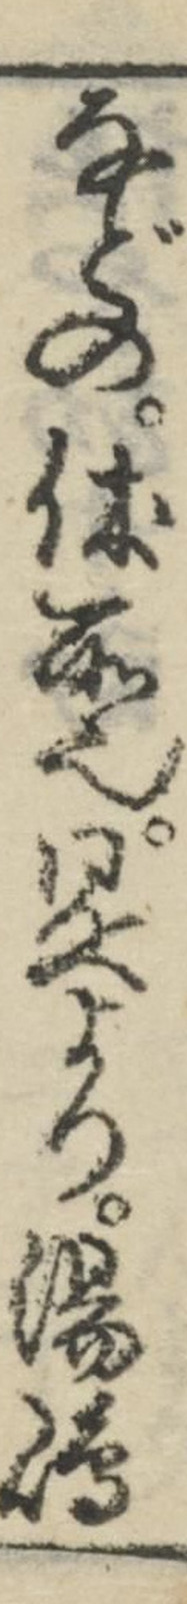などの。休所也。是より。湯嶋
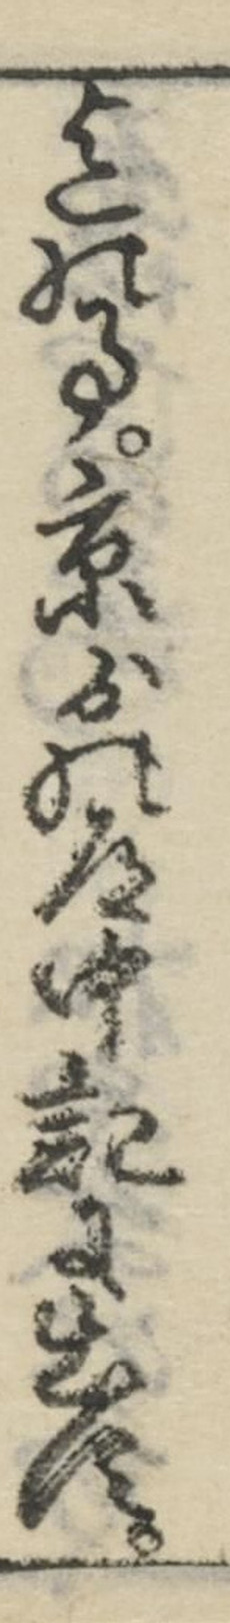迄の事。京ゟの道中記に出す。
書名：但州城崎浴湯辧
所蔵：東京大学地震研究所図書室 Earthquake Research Institute Library, The University of Tokyo, JAPAN
